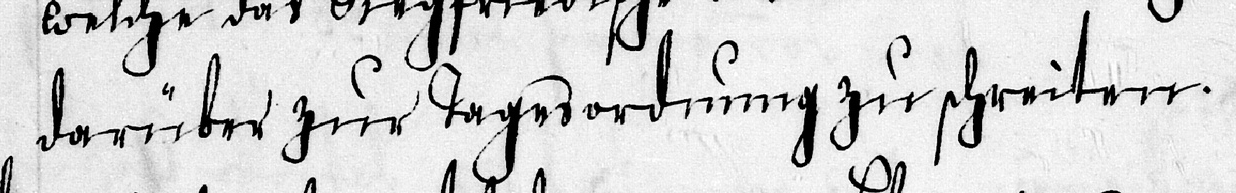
darüber zur Tagesordnung zu schreiten.
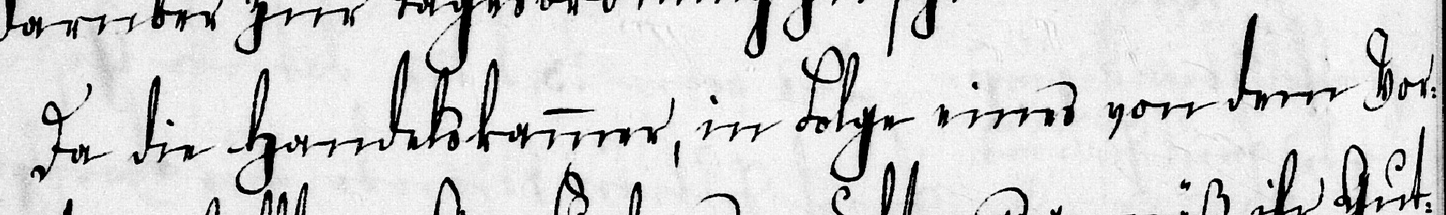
Da die Handelskammer, in Folge eines von dem Vor¬
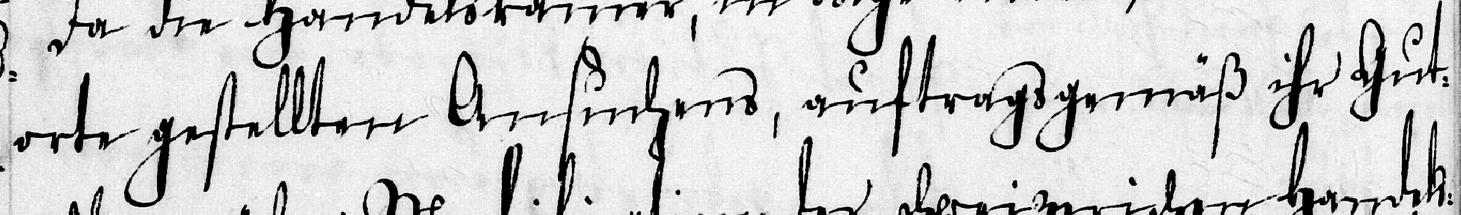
orte gestellten Ansuchens, auftragsgemäß ihr Gut¬
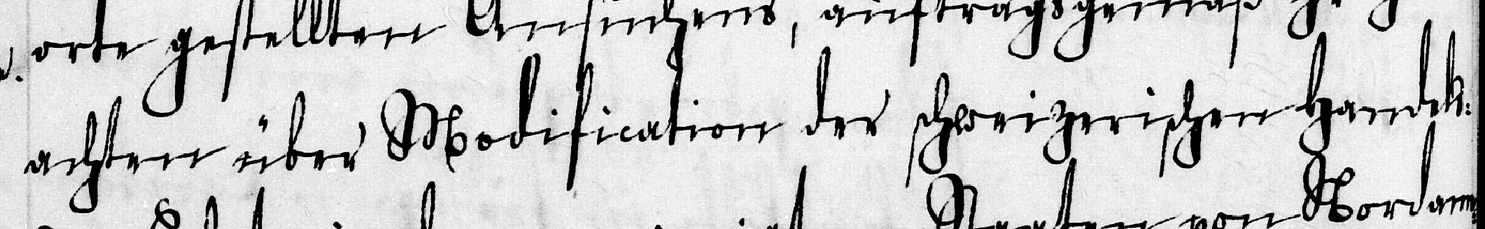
achten über Modification der schweizerischen Handel¬
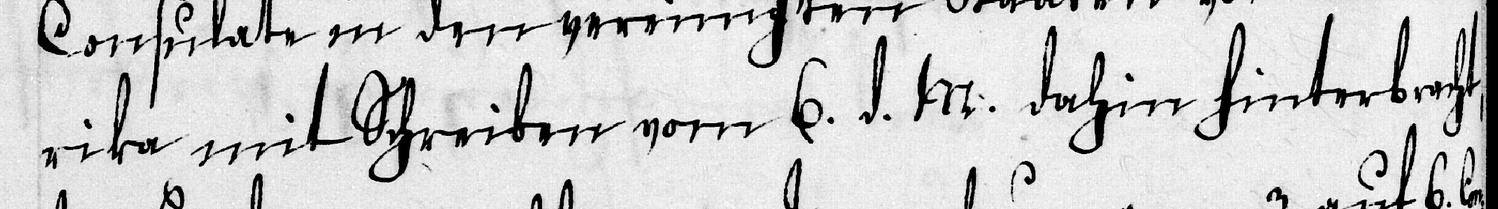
erika mit Schreiben vom 6. d. M. dahin hinterbrach¬
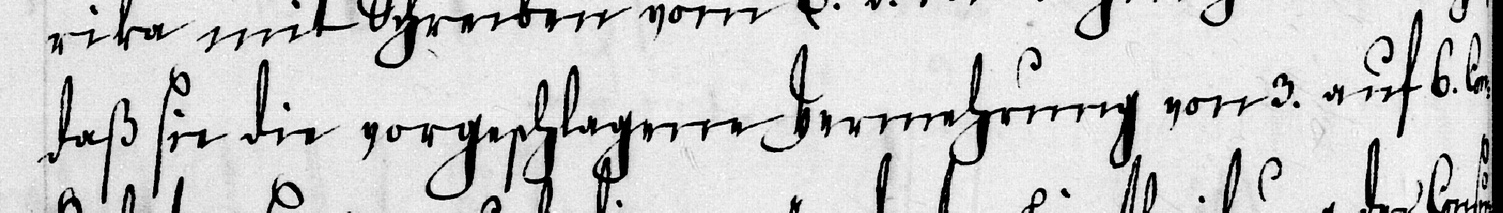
daß sie die vorgeschlagene Vermehrung von 3. auf 6.
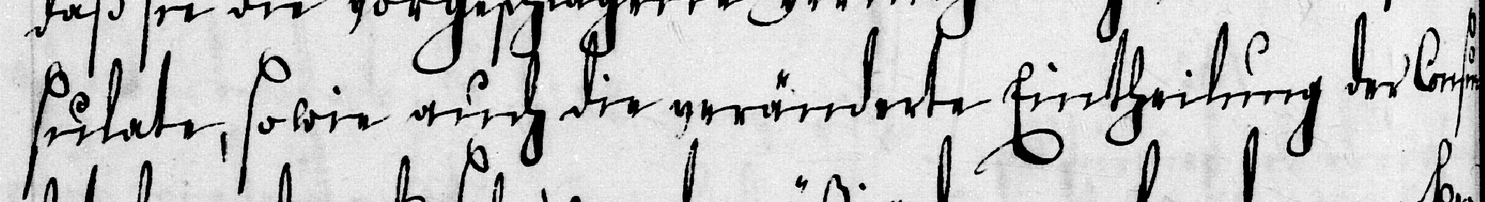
sulate, sowie auch die veränderte Eintheilung der Co¬
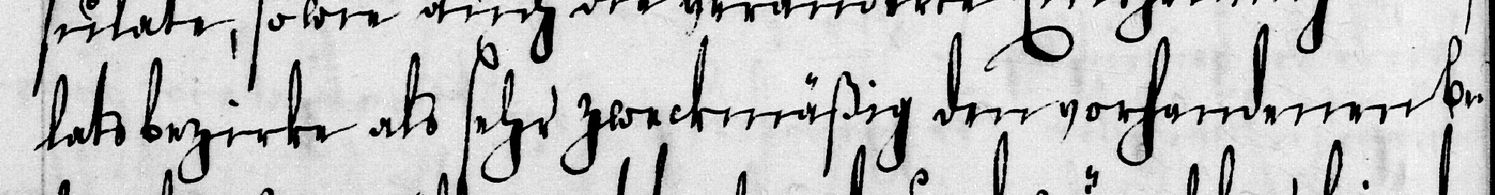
lats Bezirke als sehr zweckmäßig den vorhandenen B¬
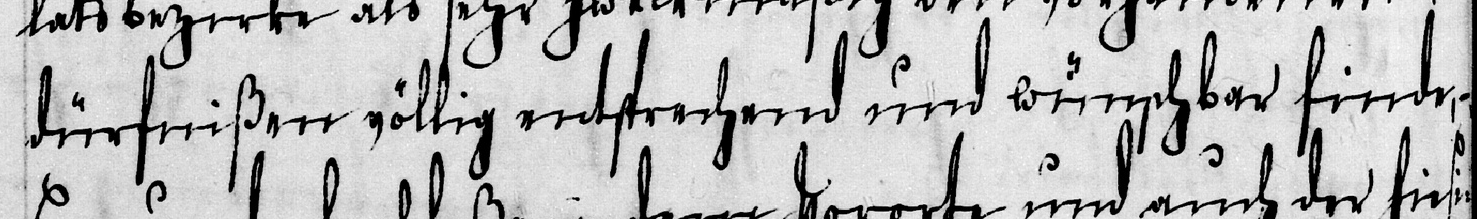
edürfnißen völlig entsprechend und wünschbar finde,
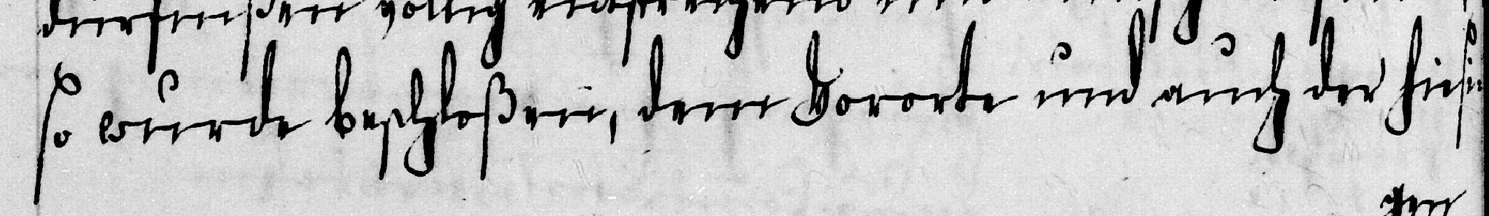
so wurde beschloßen, dem Vororte und auch der hie¬
